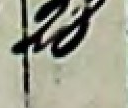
28
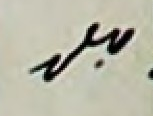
do
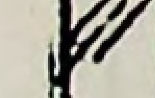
91
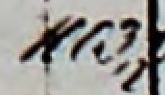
1003,2
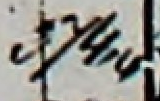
374,4
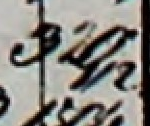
329,2
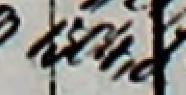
1504,0
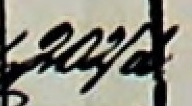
202/d
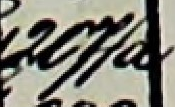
207/d
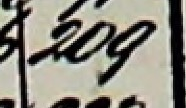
209
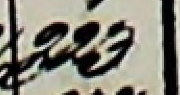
223
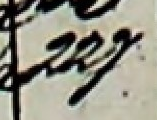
227
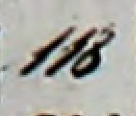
118
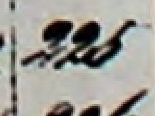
225
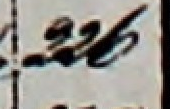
226
